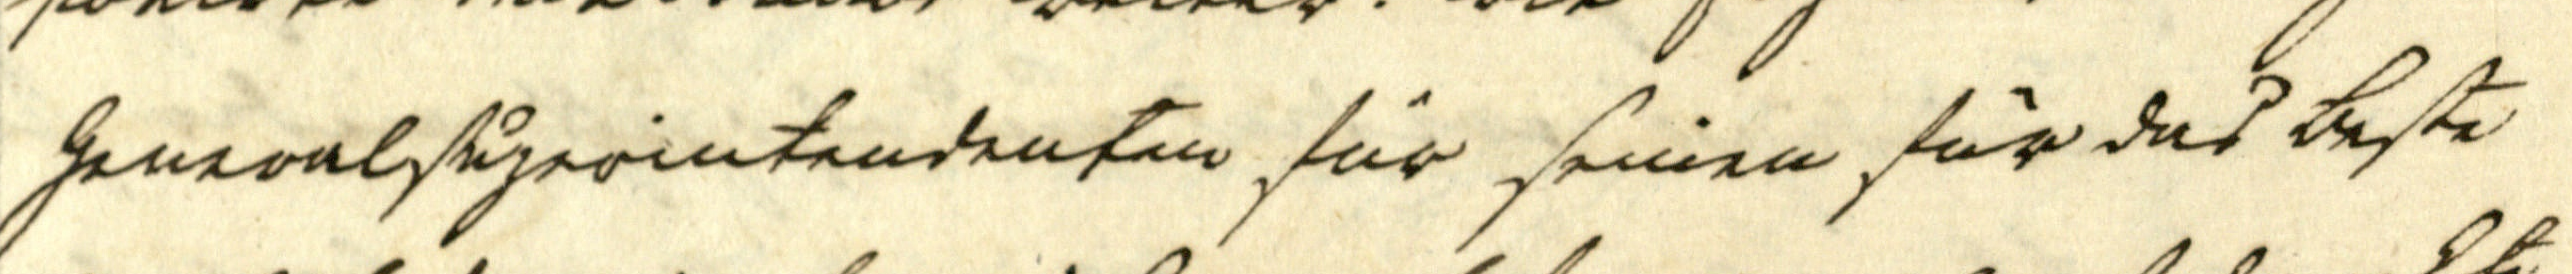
Generalstuperintendenten für seinen für das Beste
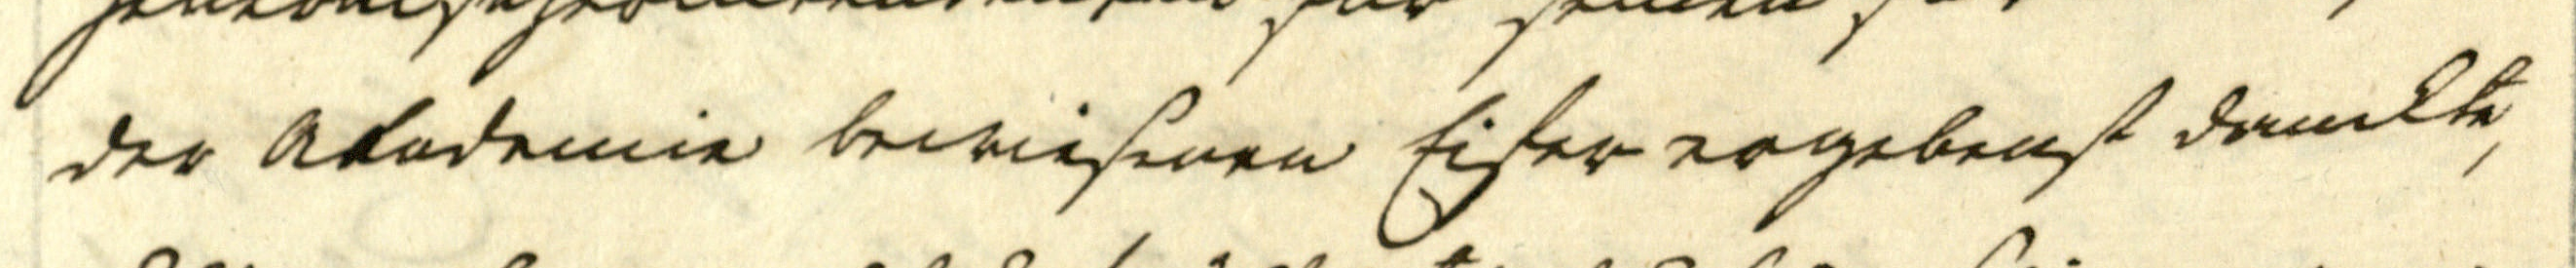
der Akademie bewiesenen Eifer ergebenst danckte,
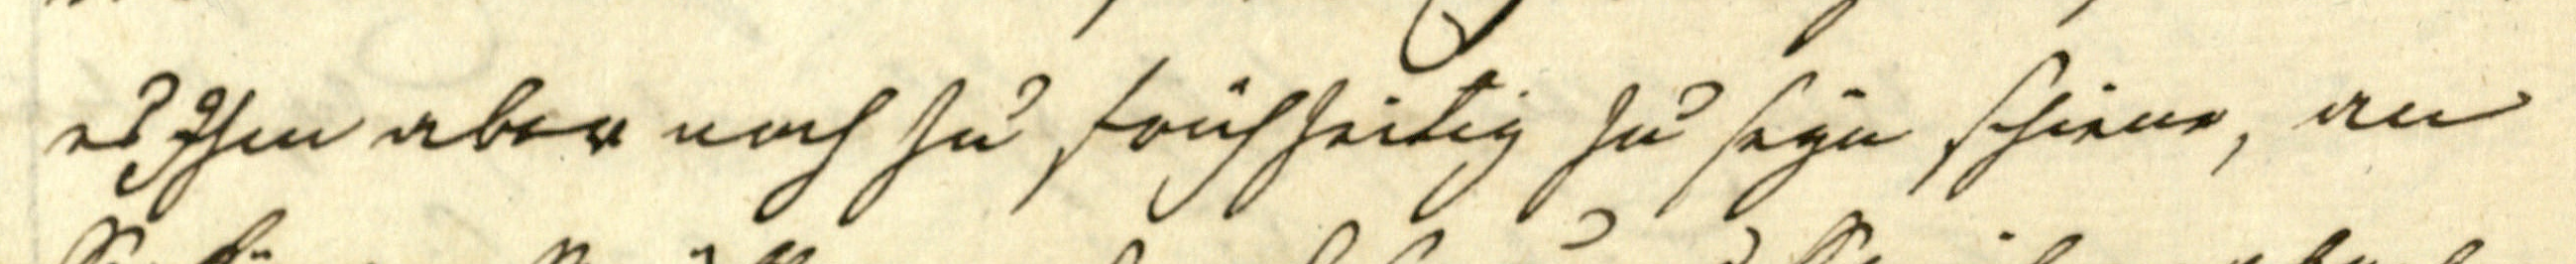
es Ihm aber noch zu frühzeitig zu seÿn schiene, an
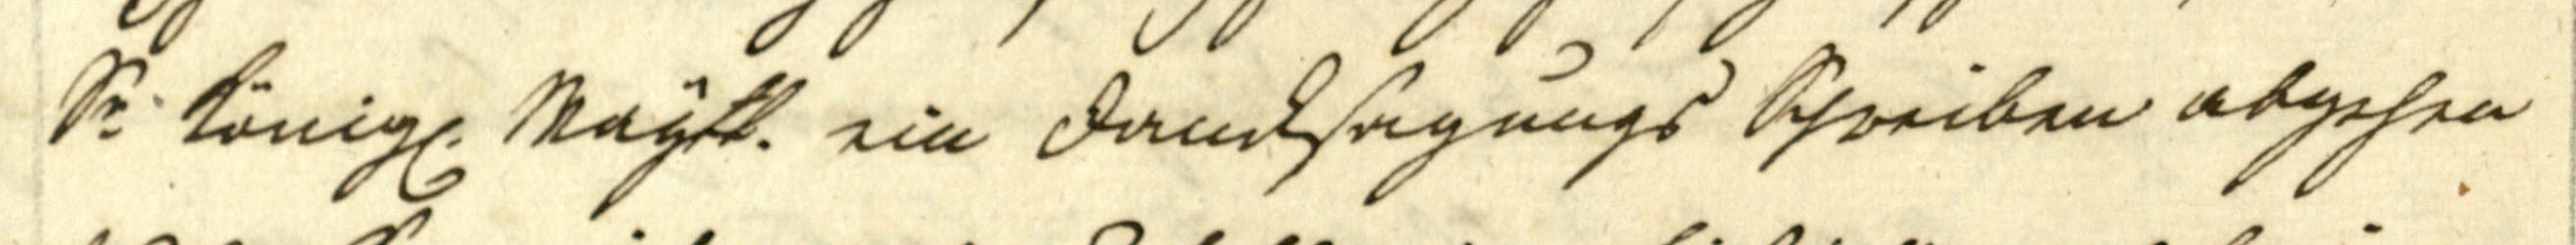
Sr. Königl. Maÿtt. ein Dancksagungs Schreiben abgehen
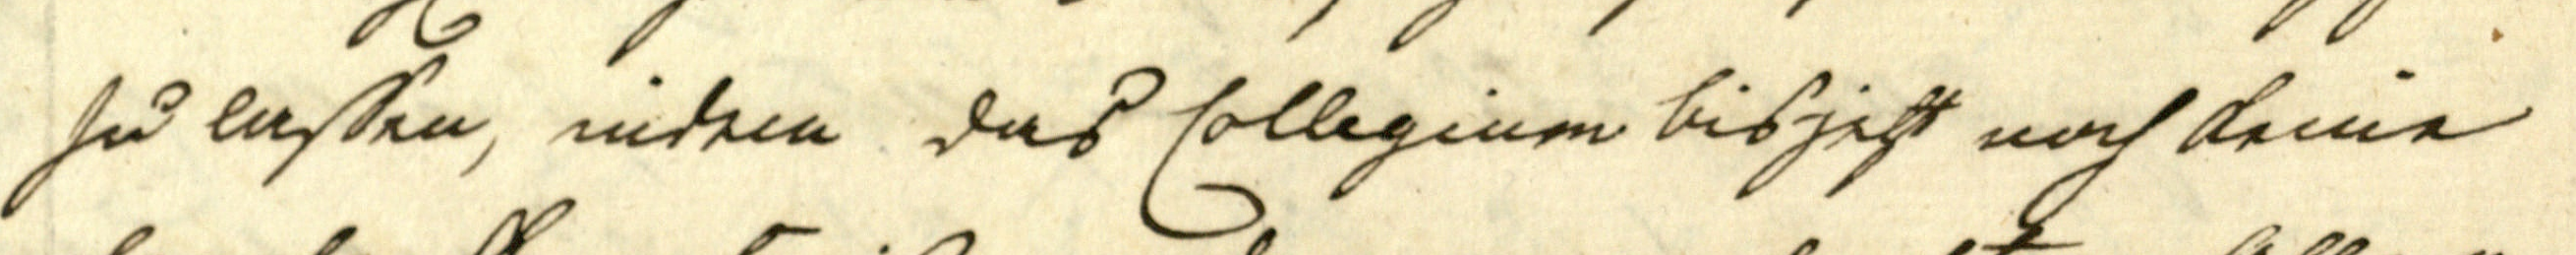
zu lassen, indem das Collegium bis jetzt noch keine
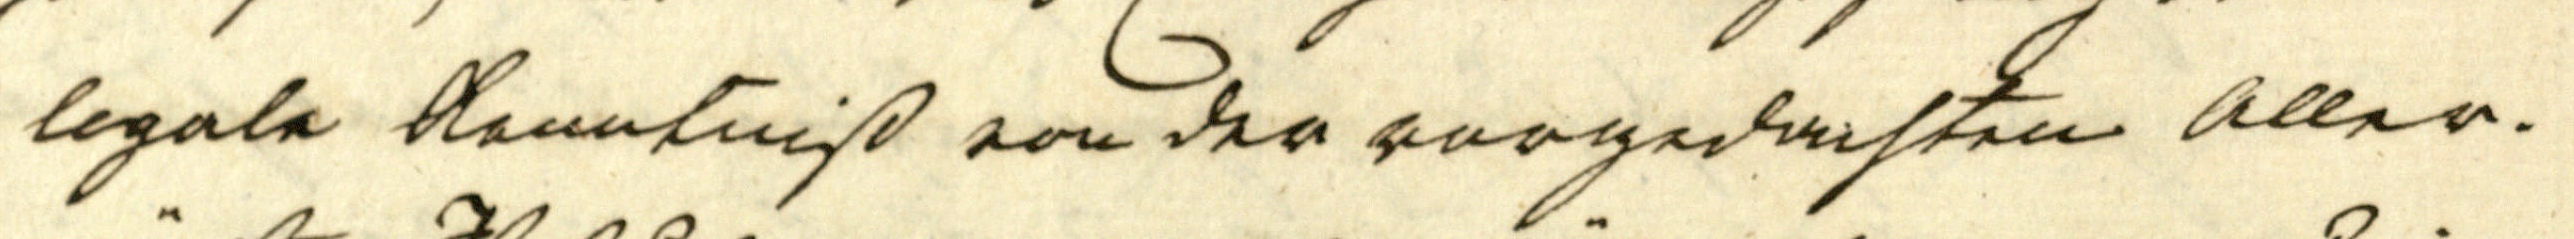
legale Kenntniß von der vorgedachten Aller-
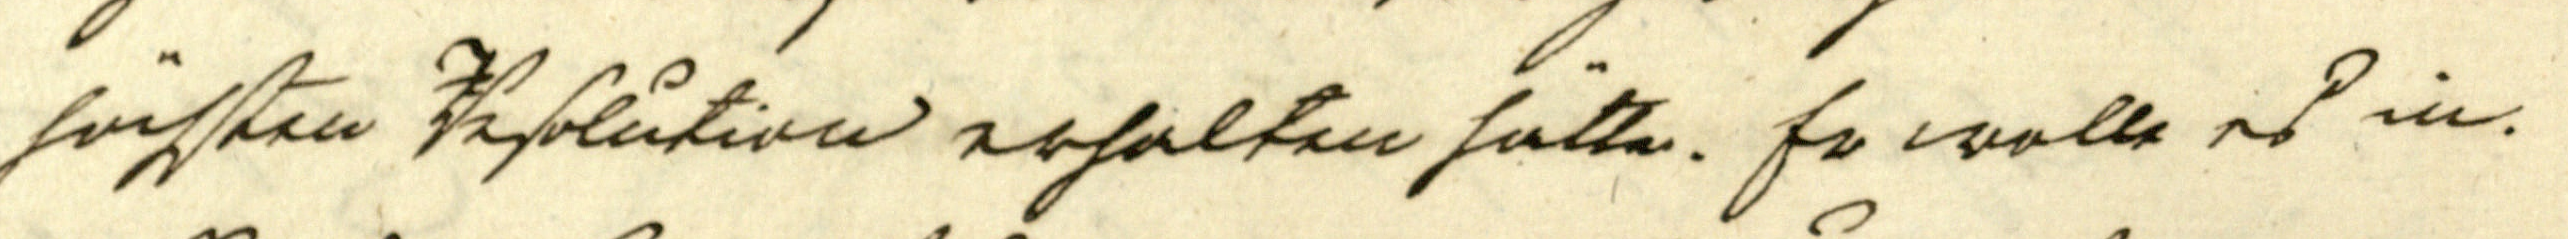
höchsten Resolution erhalten hätte. Er wolle es in¬
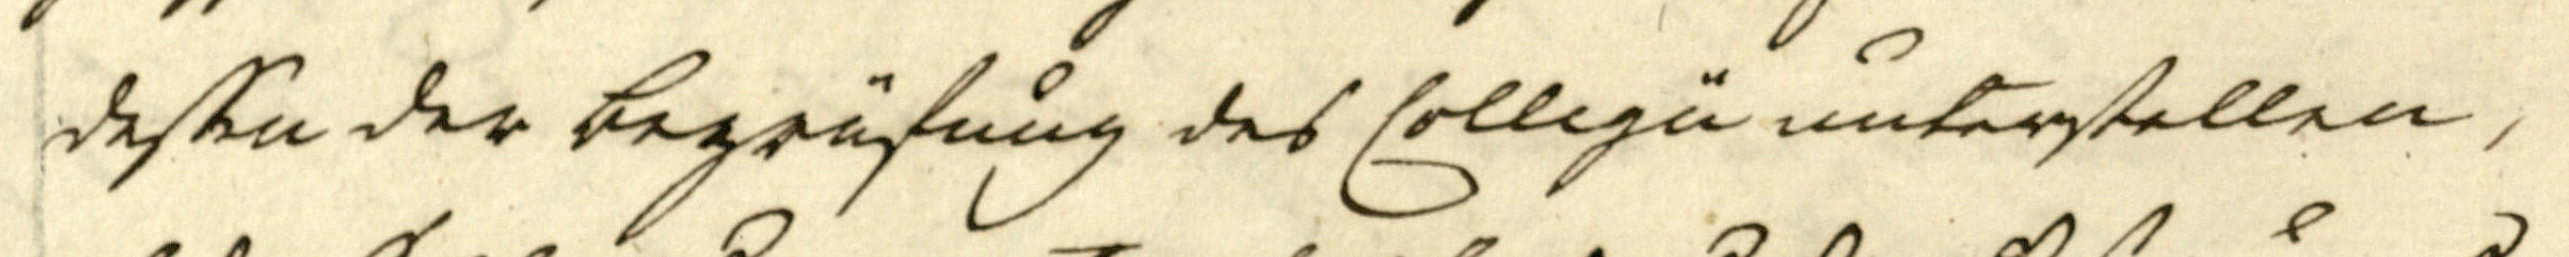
dessen der Beprüfung des Collegii unterstellen,
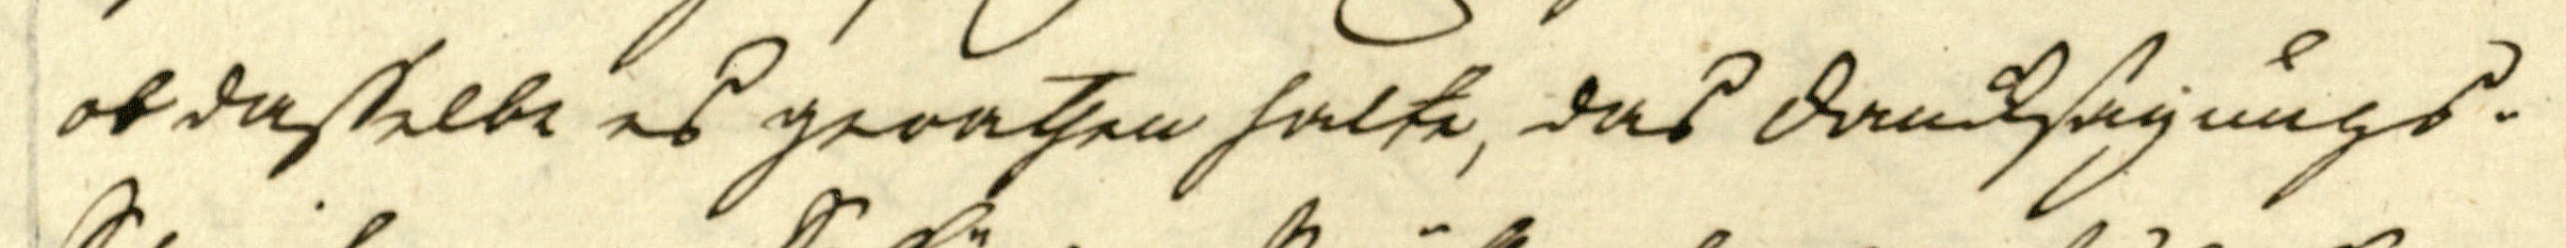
ob dasselbe es gerathen halte, das Dancksagungs¬
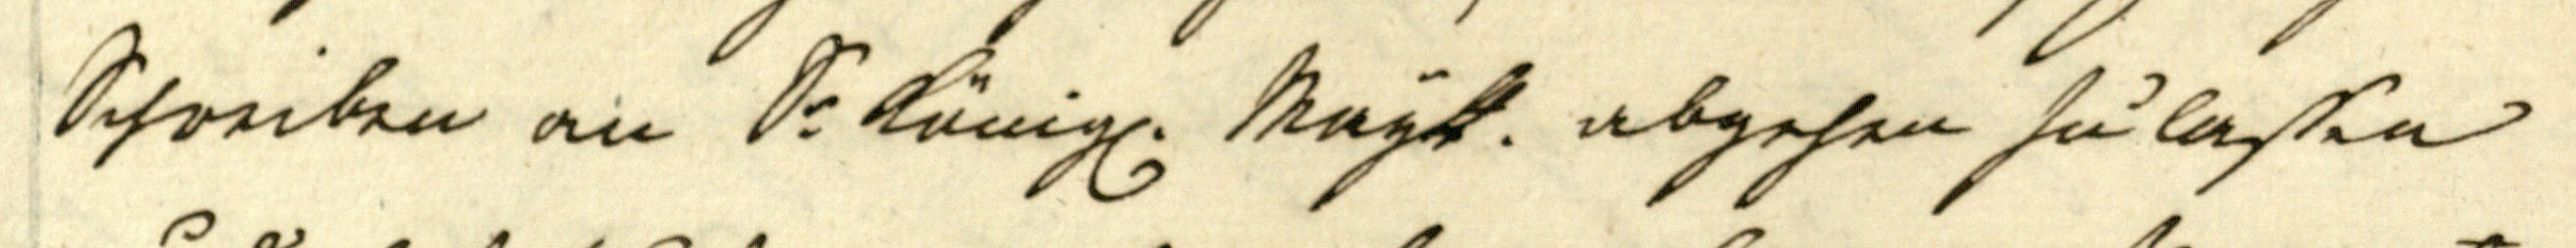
Schreiben an Sr Königl. Maÿtt. abgehen zu lassen
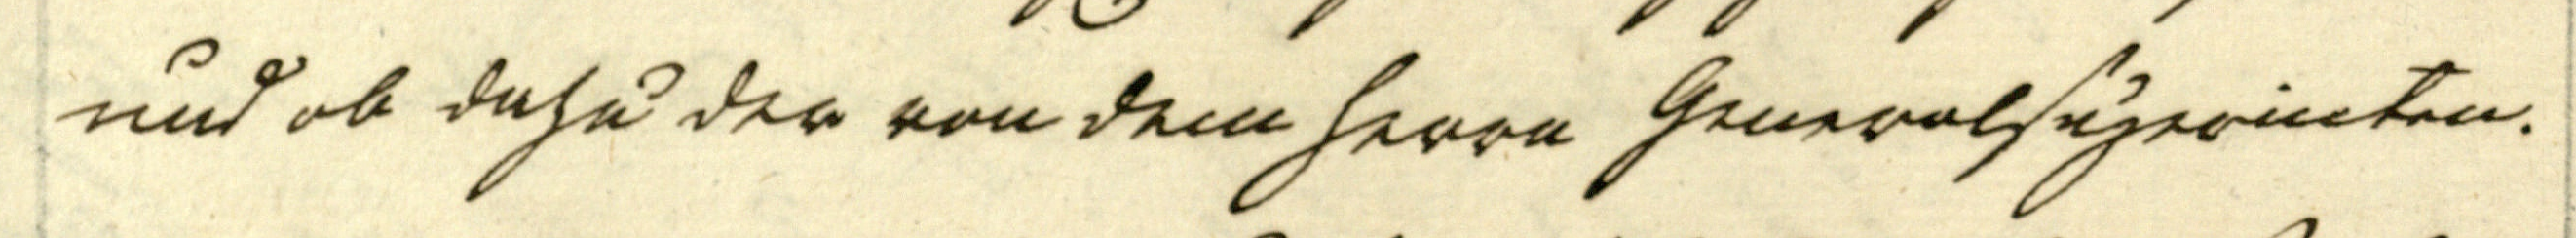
und ob dazu der von dem Herrn Generalsuperinten¬
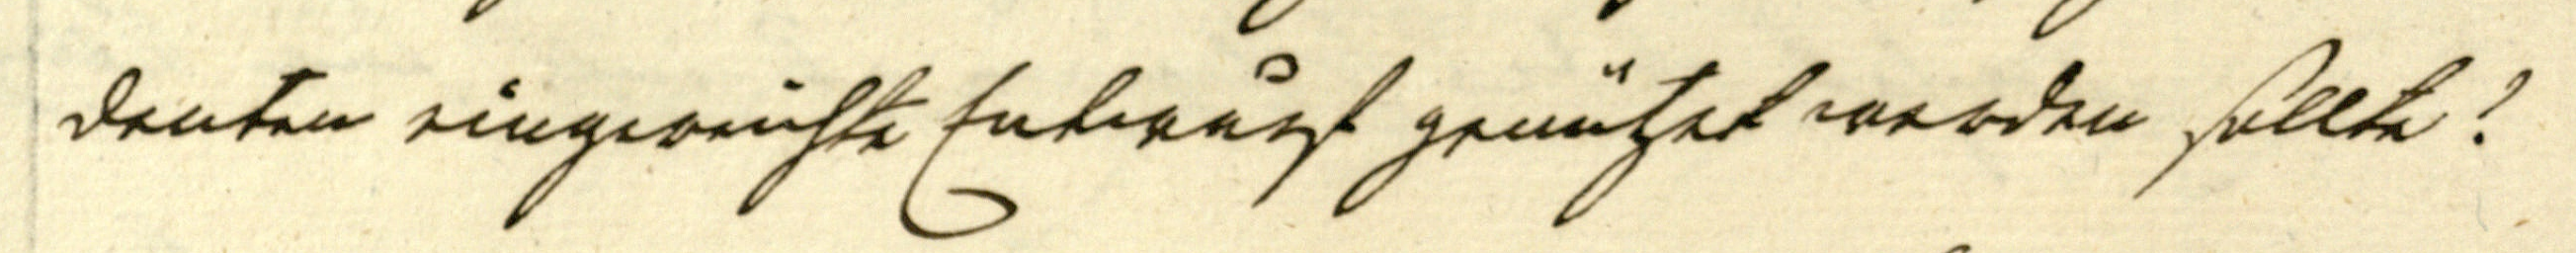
denten eingereichte Entwurf genützet werden sollte?
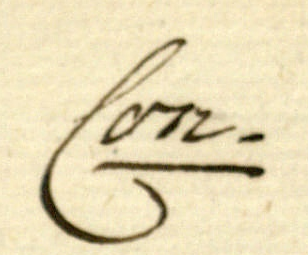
Con.
